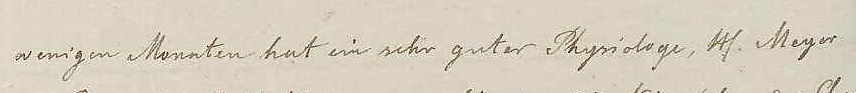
wenigen Monaten hat ein sehr guter Physiologe, H￼. Meyer
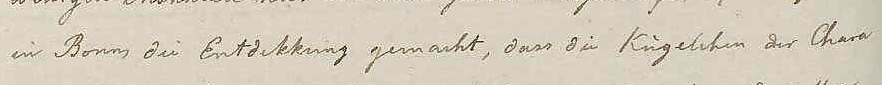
in Bonn, die Entdekkung gemacht, dass die Kügelchen der Chara
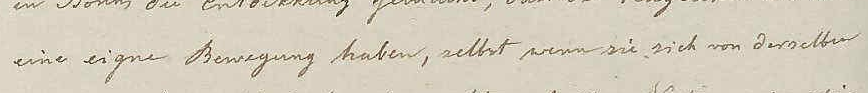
eine eigne Bewegung haben, selbst wenn sie sich von derselben
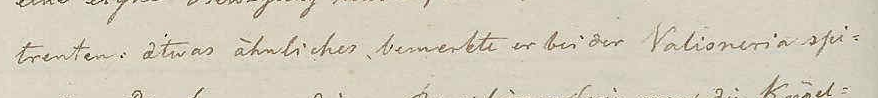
trenten: detwas ähnliches bemerkte er bei der Valisneria spi-
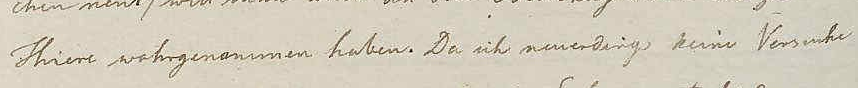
Thiere wahrgenommen haben. Da ich neuerdings keine Versuche
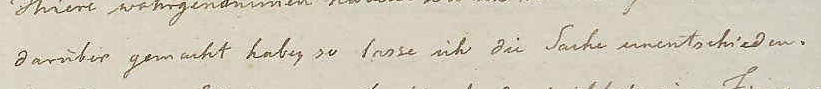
darüber gemacht habe, so lasse ich die Sache unentschieden.
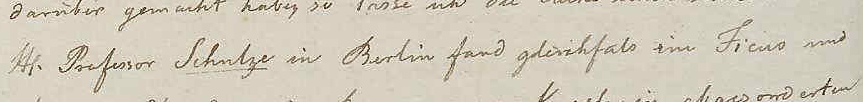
H￼. Professor Schulze in Berlin fand gleichfals im Ficus und
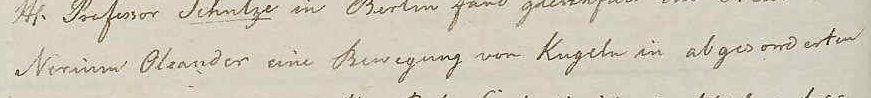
Nerium Oleander eine Bewegung von Kugeln in abgesonderten
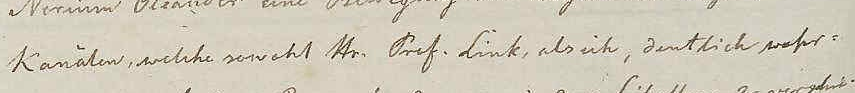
Kanälen, welche sowohl Hr. Prof. Link, als ich, deutlich wahr-
